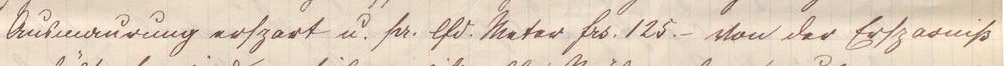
Ausmaurung erspart u. pr. lfd. Meter frs. 125.– von der Ersparniß
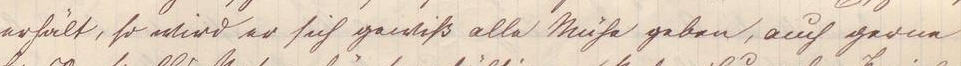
erhält, so wird er sich gewiß alle Mühe geben, auch gerne
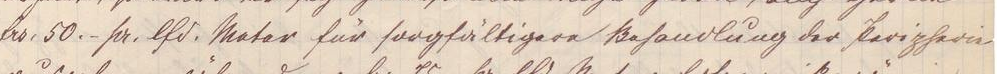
frs. 50.– pr. lfd. Meter für sorgfältigere Behandlung der Peripherie
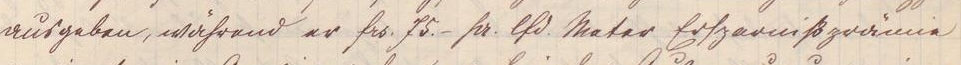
ausgeben, während er frs. 75.– pr. lfd. Meter Ersparnißprämie
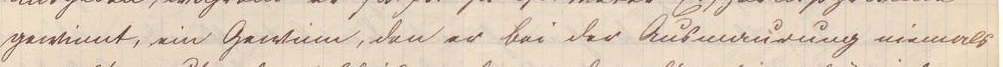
gewinnt, ein Gewinn, den er bei der Ausmaurung niemals
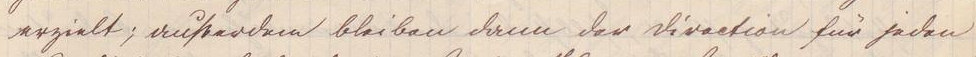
erzielt; außerdem bleiben dann der Direction für jeden
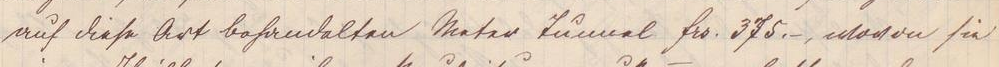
auf diese Art behandelten Meter Tunnel frs. 375.–, wovon sie
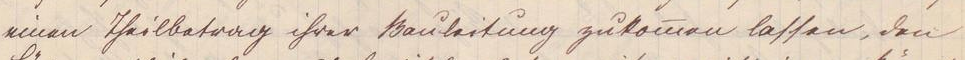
einen Theilbetrag ihrer Bauleitung zukommen lassen, den
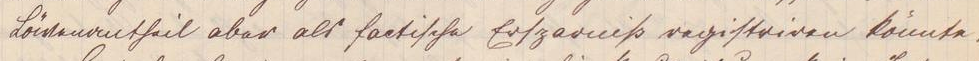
Löwenantheil aber als factische Ersparniß registriren könnte.
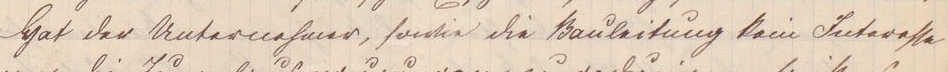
Hat der Unternehmer, sowie die Bauleitung kein Interesse
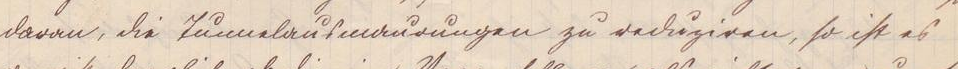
daran, die Tunnelausmaurungen zu reduziren, so ist es
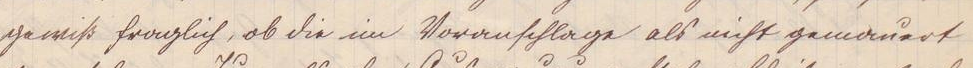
gewiß fraglich, ob die im Voranschlage als nicht gemauert
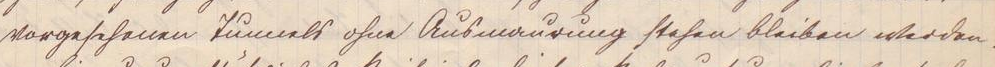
vorgesehenen Tunnels ohne Ausmaurung stehen bleiben werden.
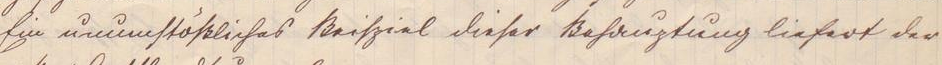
Ein unumstößliches Beispiel dieser Behauptung liefert der
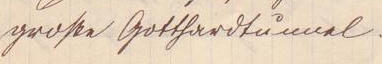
große Gotthardtunnel.
